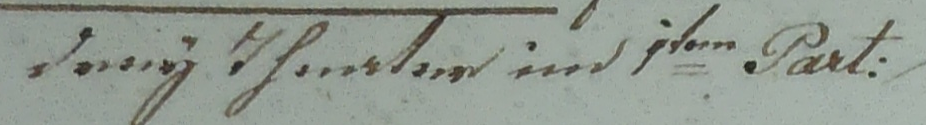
drey Theater im 1te͇n Part:
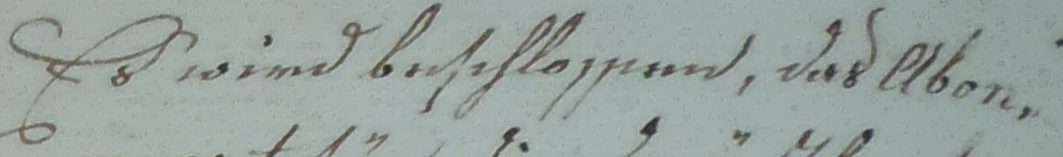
Es wird beschlossen, das Abon¬
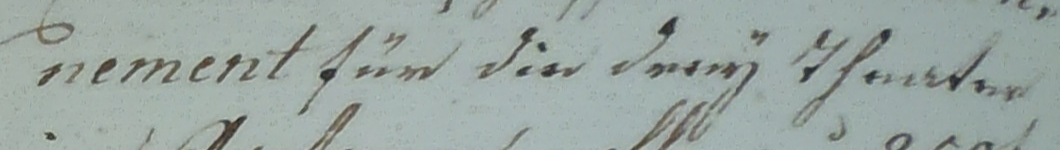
nement für die drey Theater
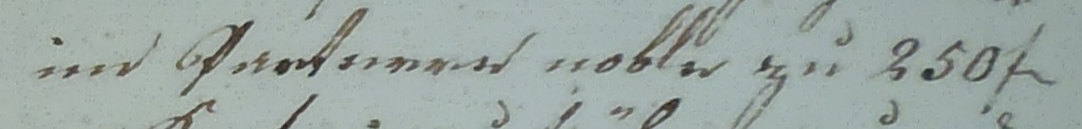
im Parterre noble zu 250fn
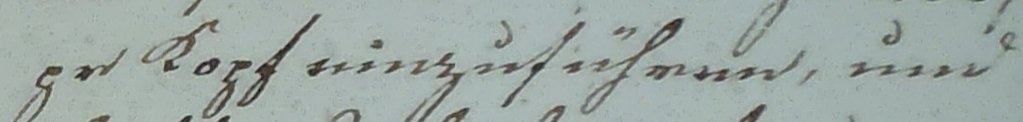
pr Kopf einzuführen, und
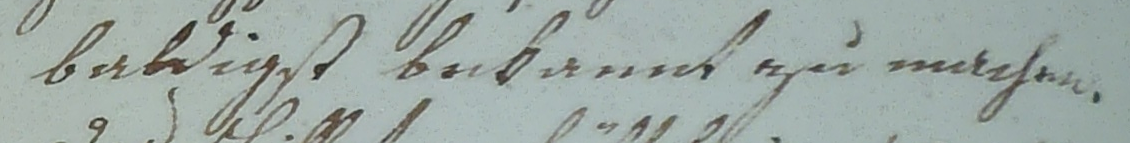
baldigst bekannt zu machen.
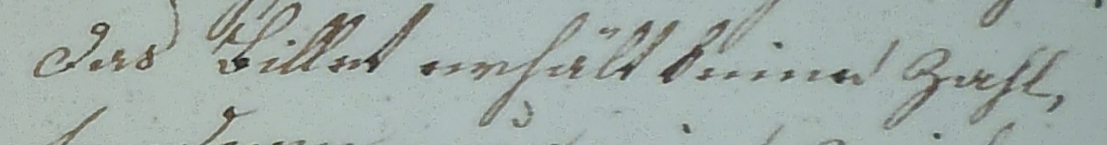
Das Billet erhält keine Zahl,
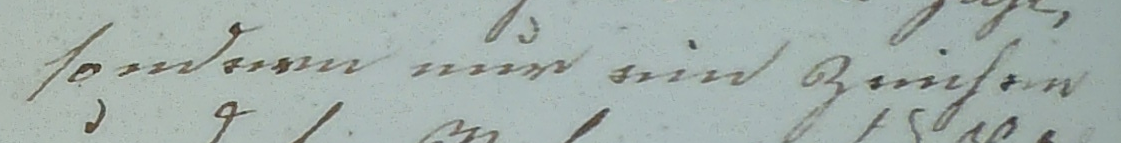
sondern nur ein Zeichen
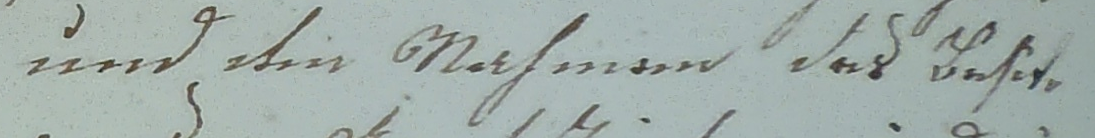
und den Nahmen des Besit¬
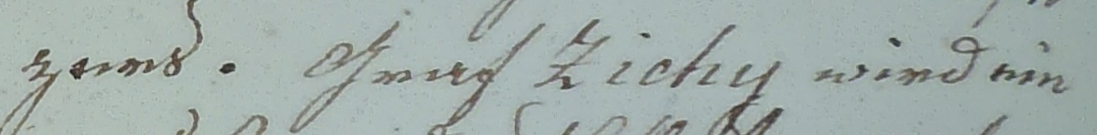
zers. Graf Zichy wird ein
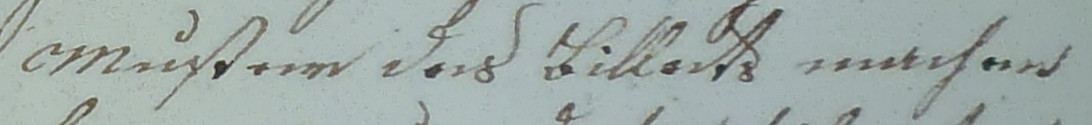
Muster des Billets machen
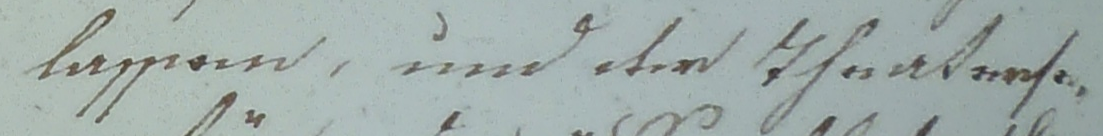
lassen, und der Theaterse¬
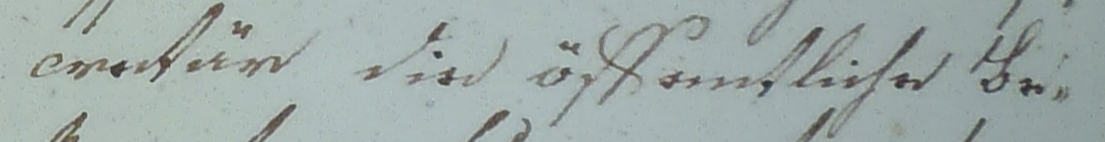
cretär die öffentliche Be¬
